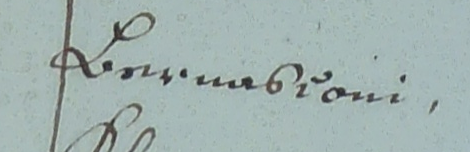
Bernasioni,
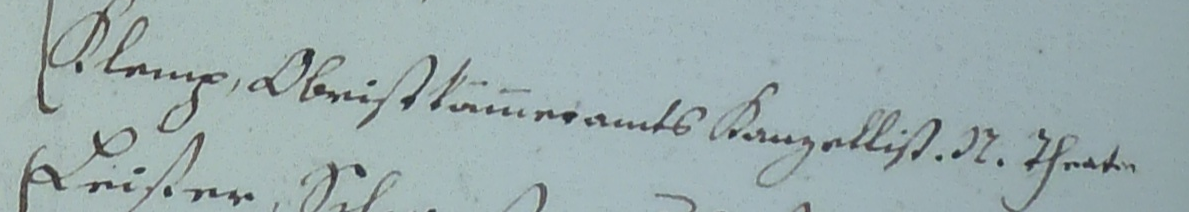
Klemp, Obristkäm̅eramts Kanzellist. N. Theater
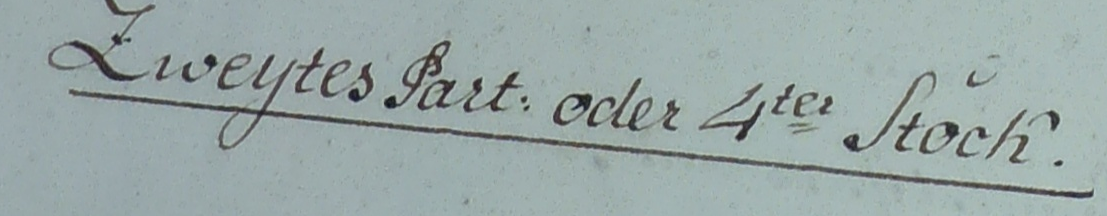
Zweytes Part: oder 4te͇r Stock.
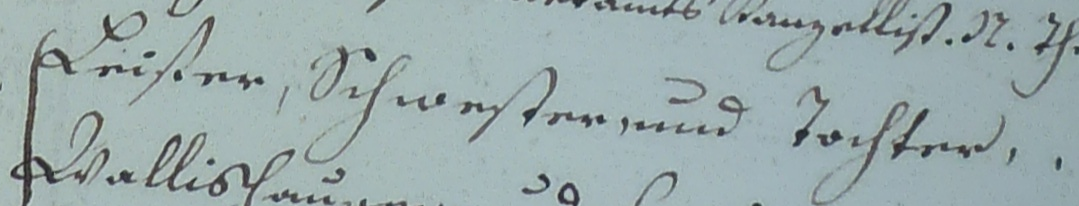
Leifer, Schwester, und Tochter, .
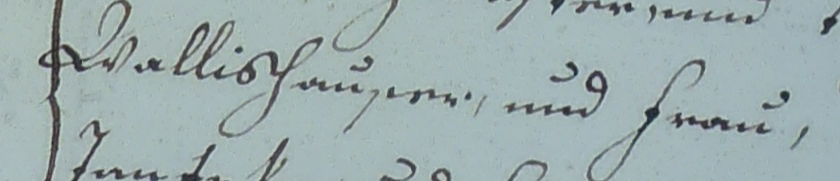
Wallishauser, und Frau,
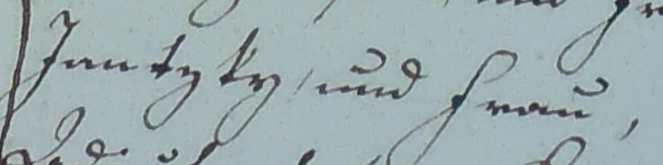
Jantzky, und Frau,
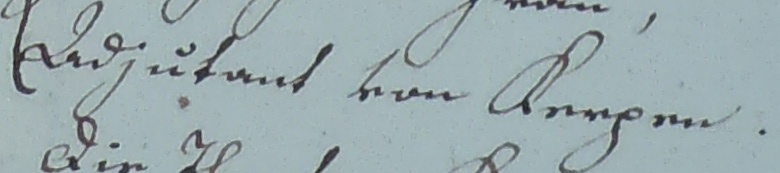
Adjutant von Kerpen.
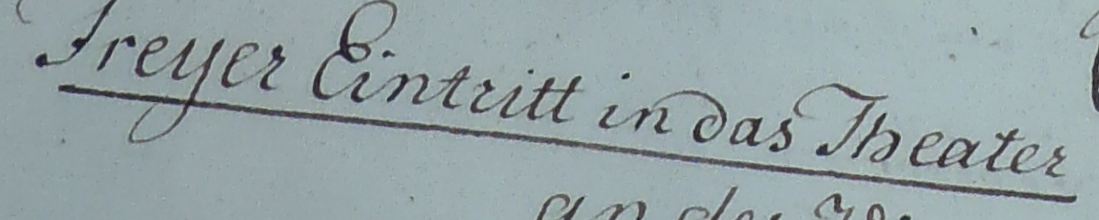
Freyer Eintritt in das Theater
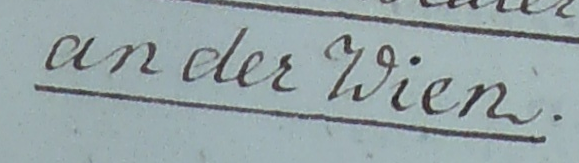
an der Wien.
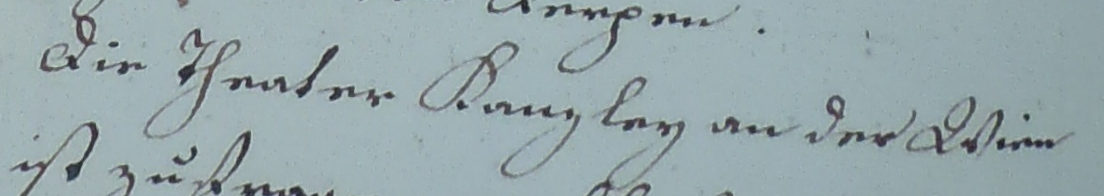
Die Theater Kanzley an der Wien
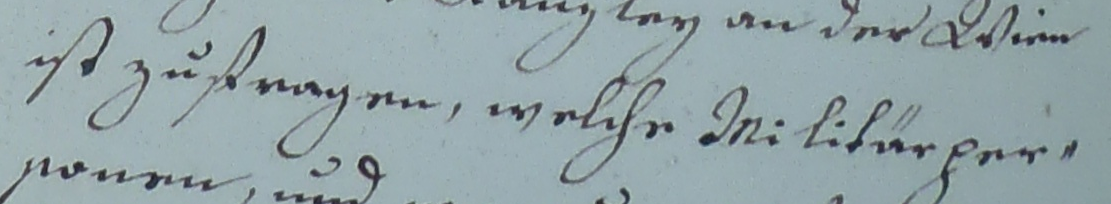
ist zufragen, welche Militärper¬
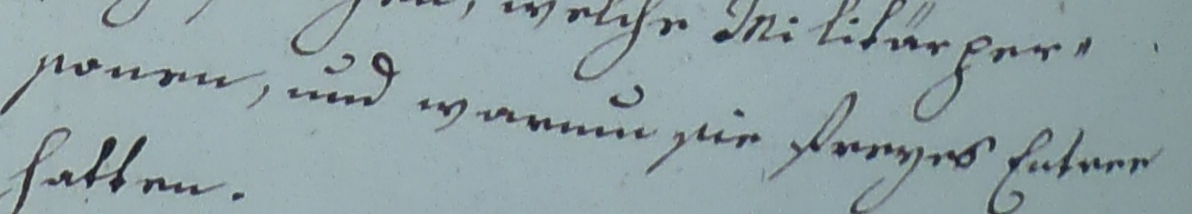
sonen, und warum sie freyes Entree
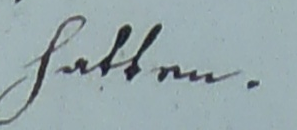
hatten.
